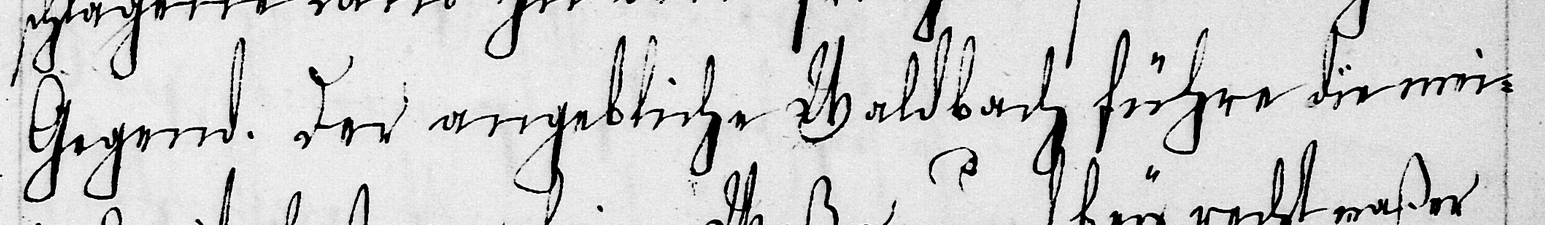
Gegend. Der angebliche Waldbach führe die mei¬
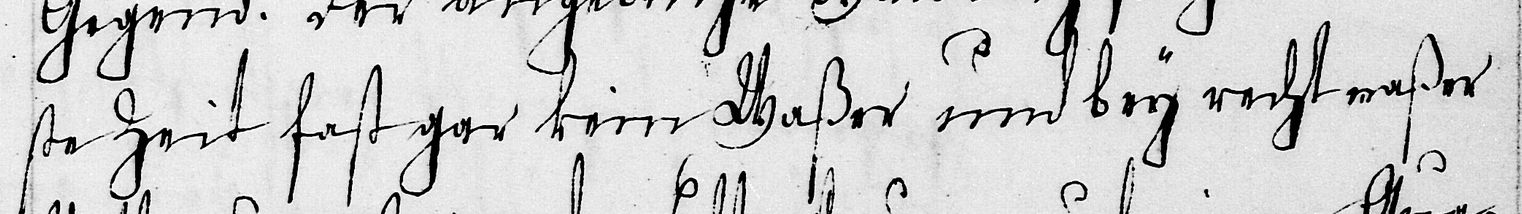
ste Zeit fast gar kein Waßer und bey recht naßer
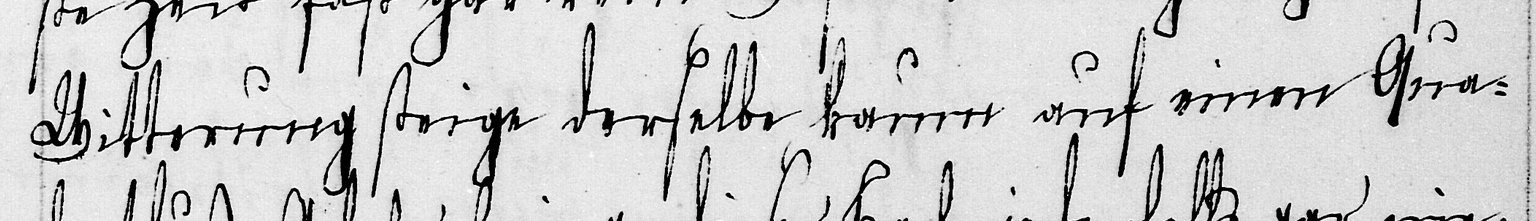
Witterung steige derselbe kaum auf einen Qua¬
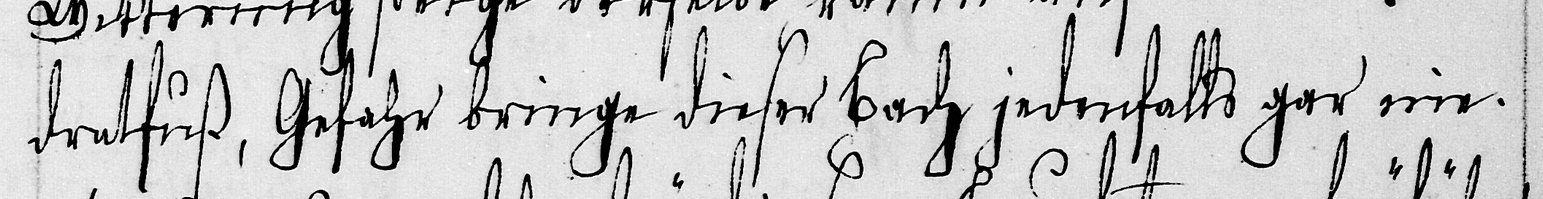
dratfuß, Gefahr bringe dieser Bach jedenfalls gar nie.
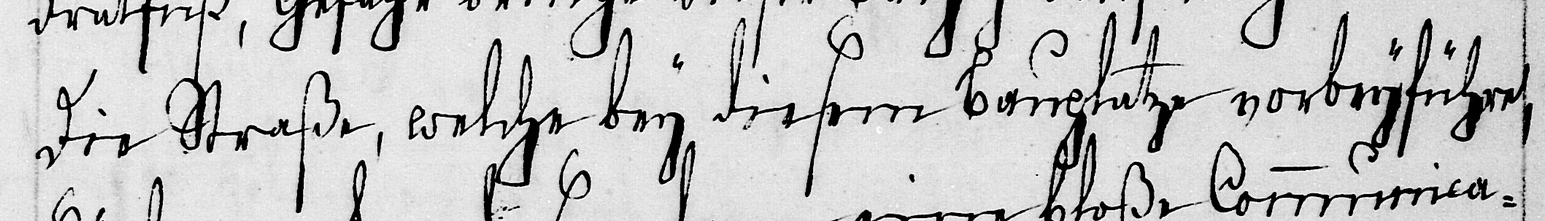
Die Straße, welche bey diesem Bauplatze vorbeyführe,
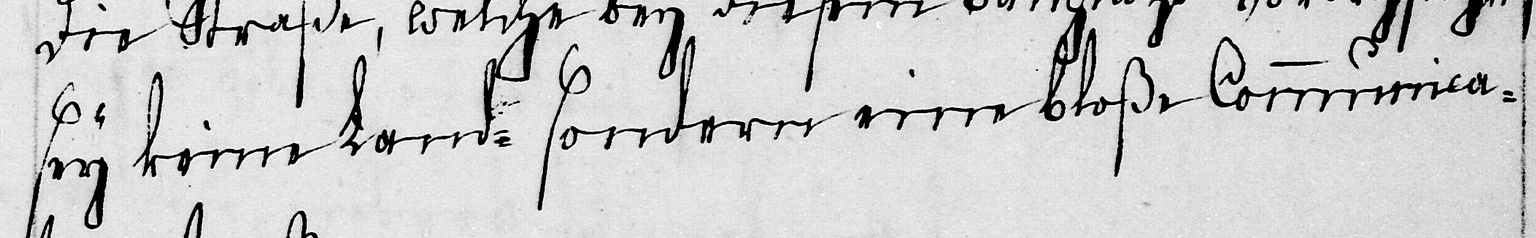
sey keine Land- sondern eine bloße Communica¬
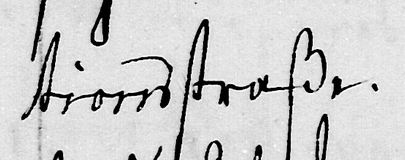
tionsstraße.
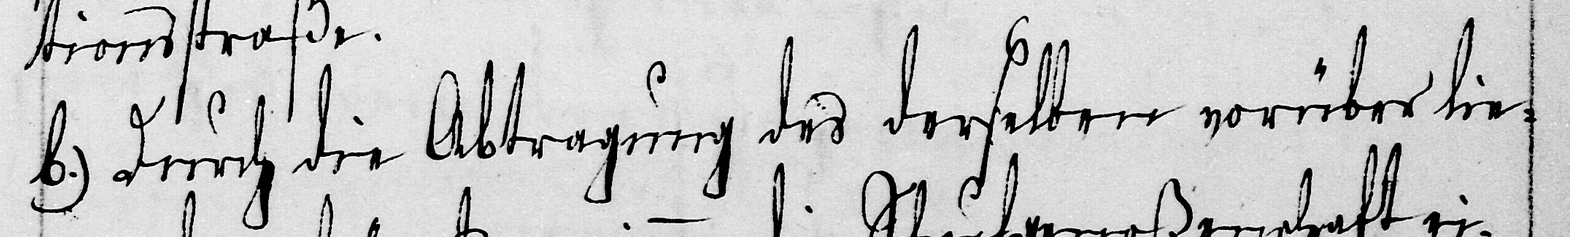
b.) Durch die Abtragung des derselben vorüber lie¬
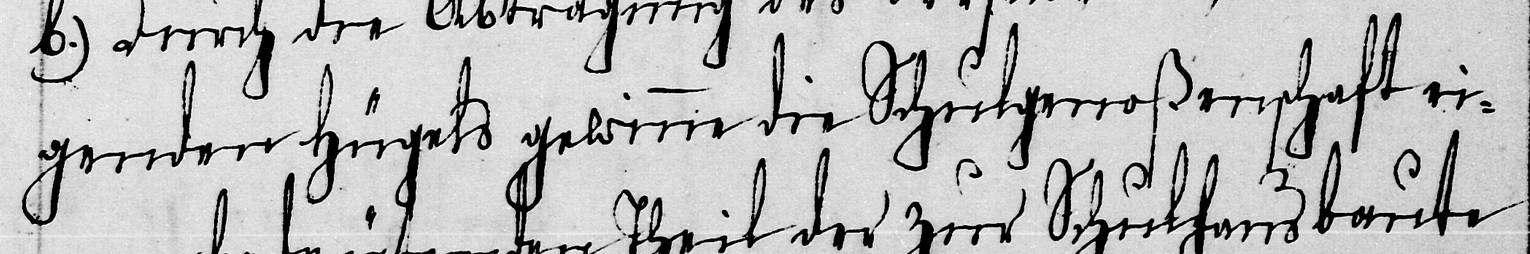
genden Hügels gewinne die Schulgenoßenschaft ei¬
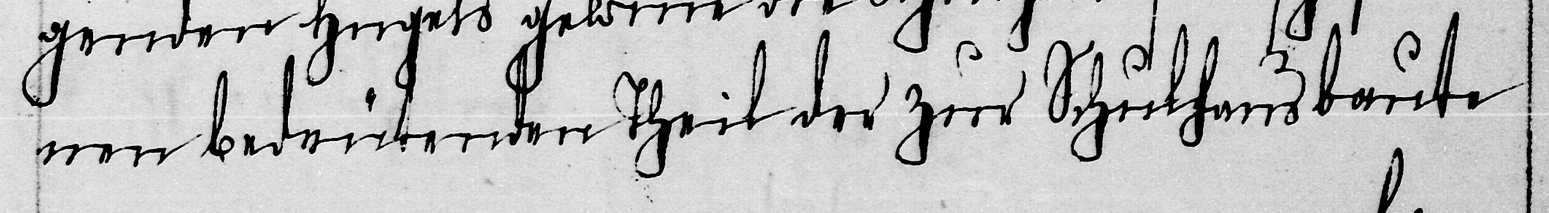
nen bedeutenden Theil der zur Schulhausbaute
